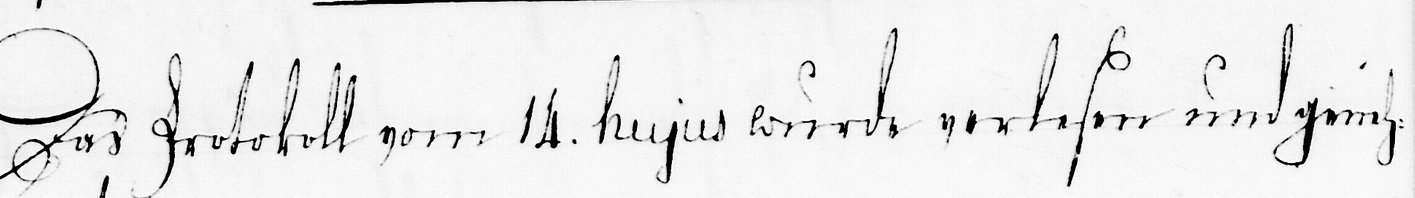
Das Protokoll vom 14. hujus wurde verlesen und gene¬
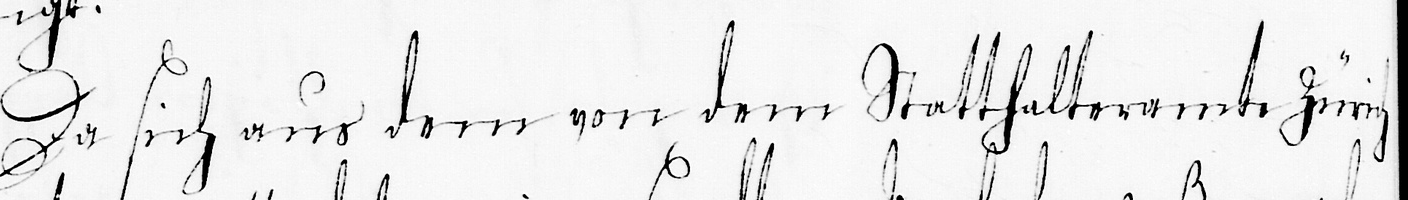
Da sich aus dem von dem Statthalteramte Züri¬
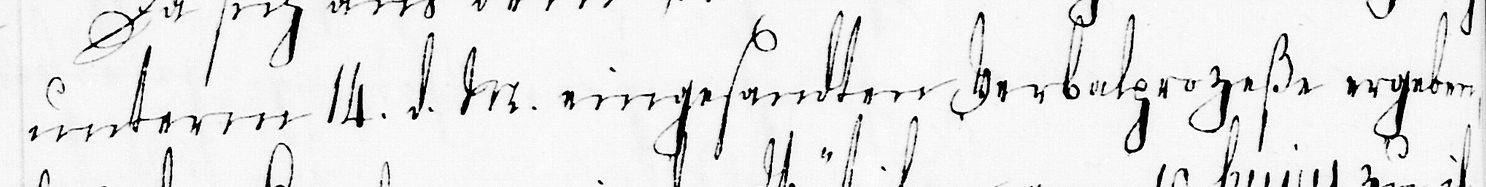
unterm 14. d. M. eingesandten Verbalprozeße ergebe¬
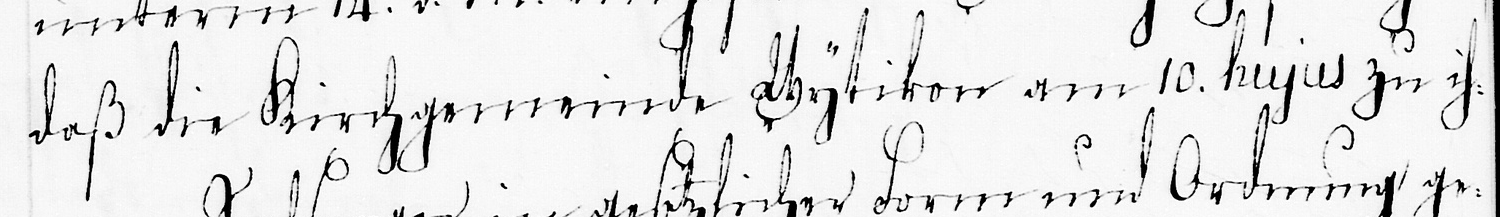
daß die Kirchgemeinde Wytikon am 10. hujus zu ih¬
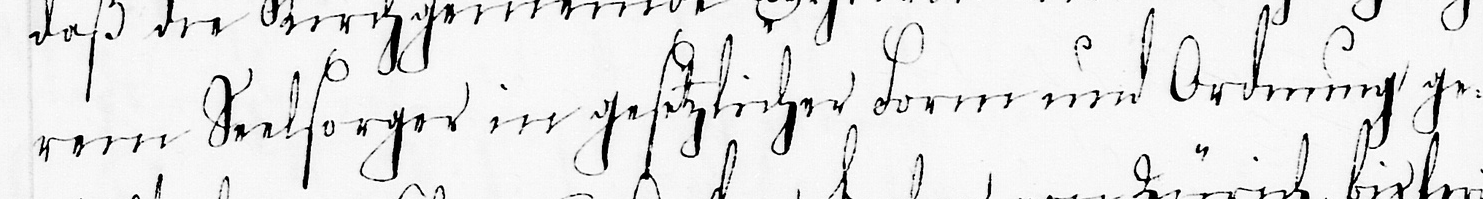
rem Seelsorger in gesetzlicher Form und Ordnung ge¬
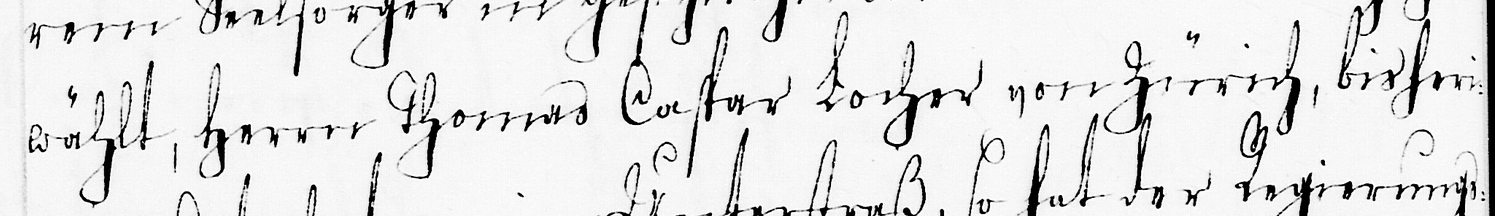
wählt, Herrn Thomas Caspar Locher von Zürich, bisher¬
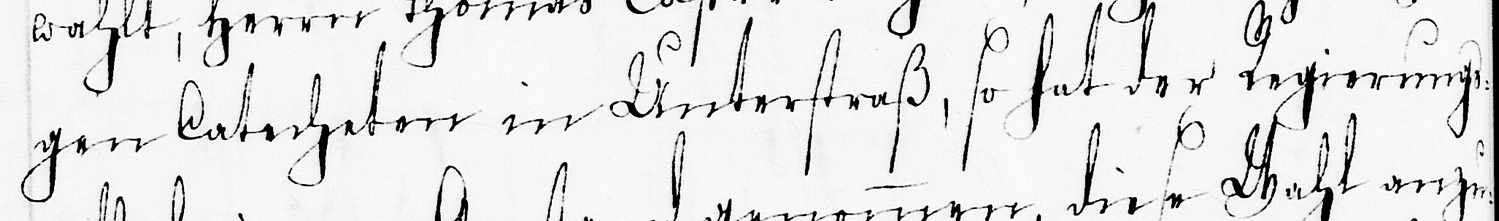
igen Catecheten in Unterstraß, so hat der Regierungs¬
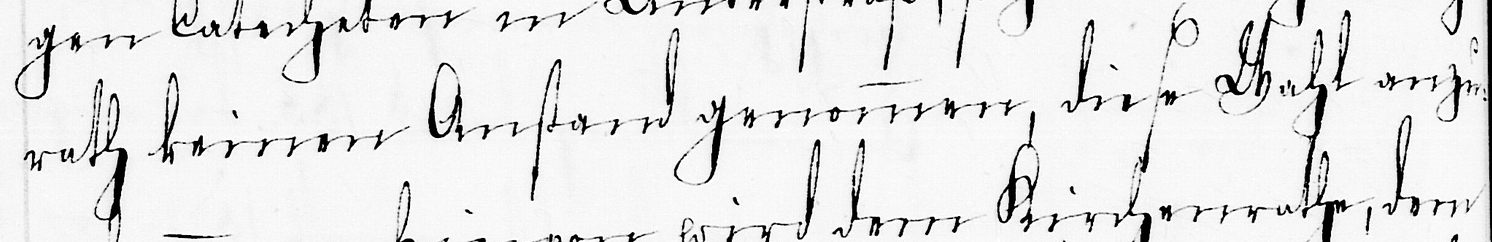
rath keinen Anstand genommen, diese Wahl anz¬
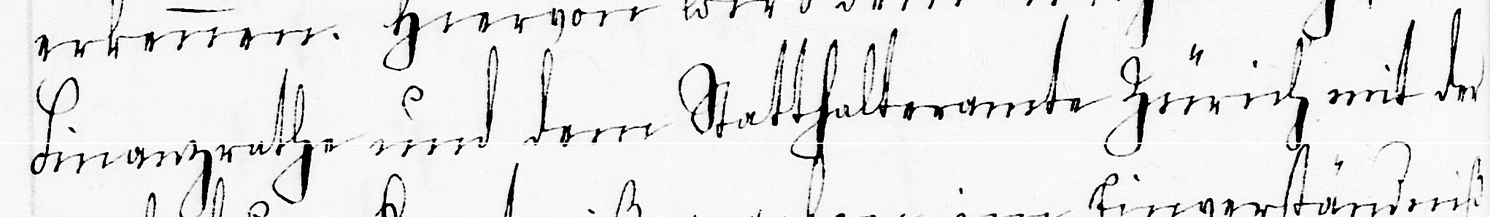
Finanzrathe und dem Statthalteramte Zürich mit d¬
